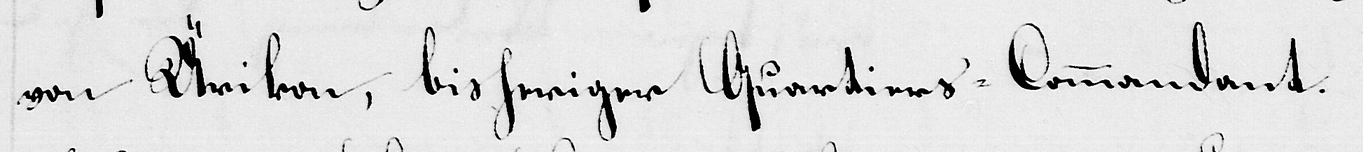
von Ürikon, bisheriger Quartiers-Commandant.
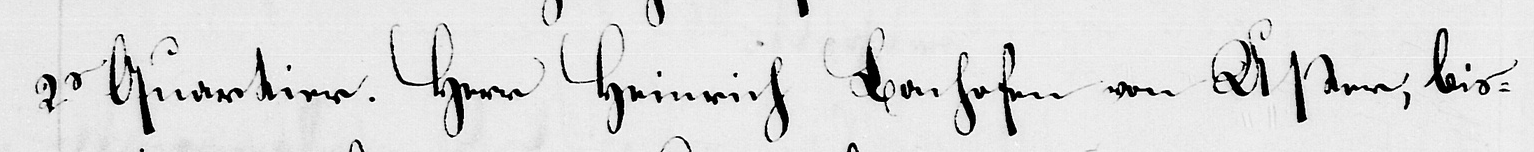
2s. Quartier. Herr Heinrich Bachofen von Uster, bis¬
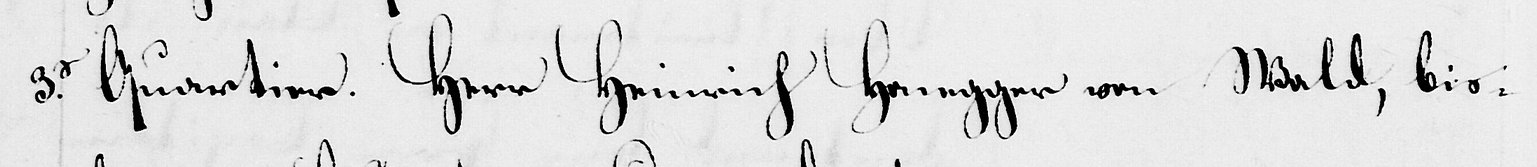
3s. Quartier. Herr Heinrich Honegger von Wald, bis¬
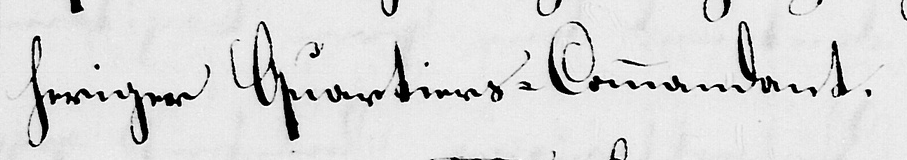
heriger Quartiers-Commandant.
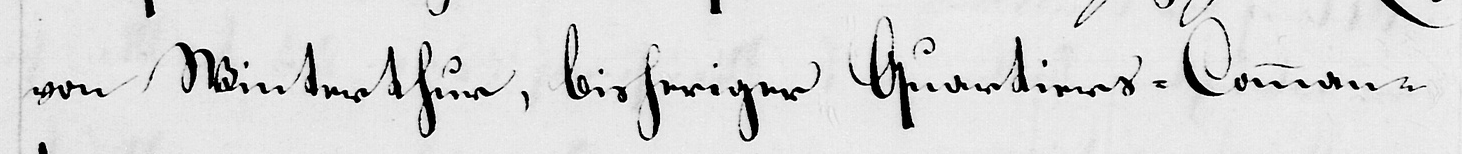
von Winterthur, bisheriger Quartiers-Comman¬
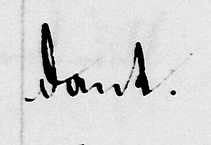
dant.
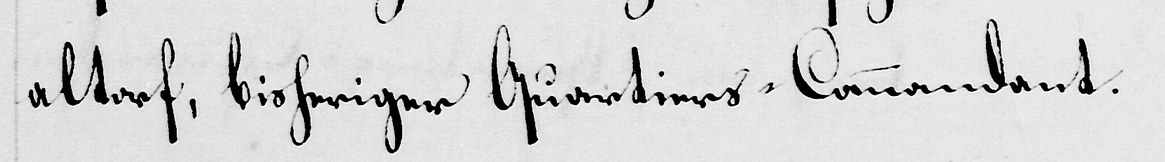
altorf, bisheriger Quartiers-Commandant.
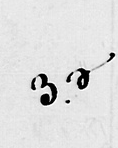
3.
